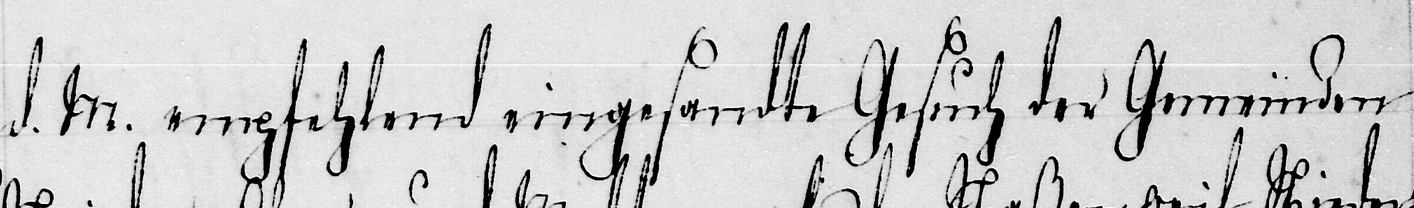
d. M. empfehlend eingesandte Gesuch der Gemeinden
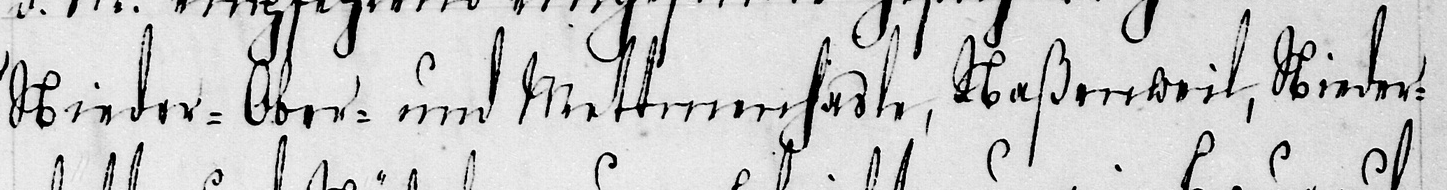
Nieder- Ober- und Mettmenhasle, Naßenweil, Nieder¬
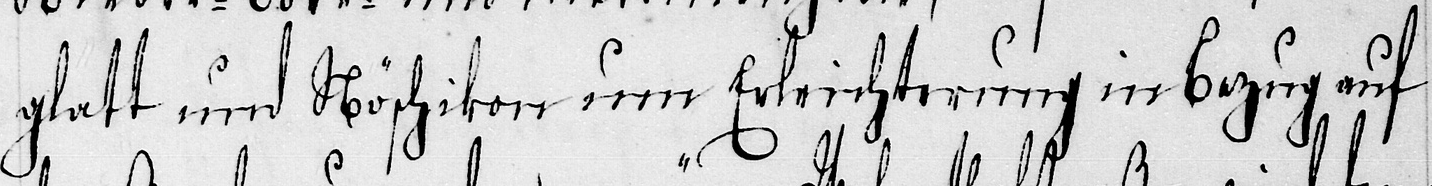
glatt und Nöschikon um Erleichterung in Bezug auf
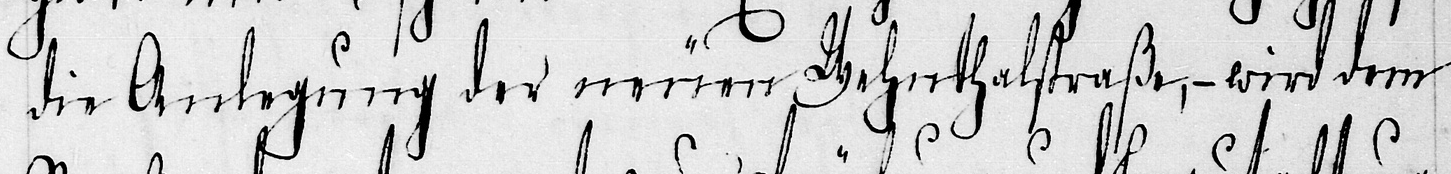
die Anlegung der neuen Wehnthalstraße, – wird dem
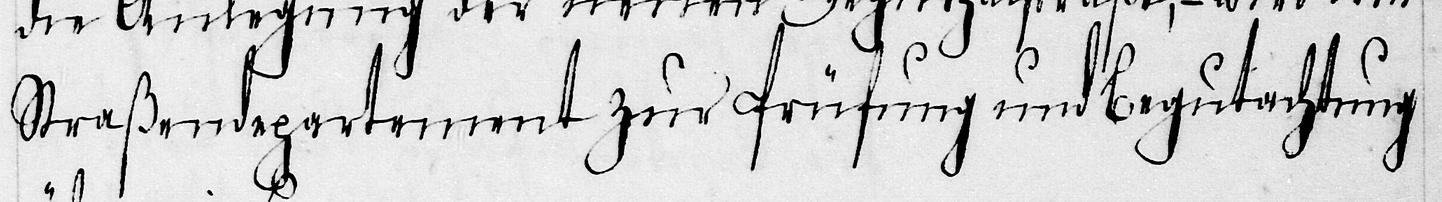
Straßendepartement zur Prüfung und Begutachtung
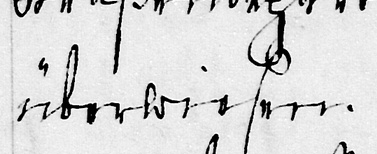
überwiesen.
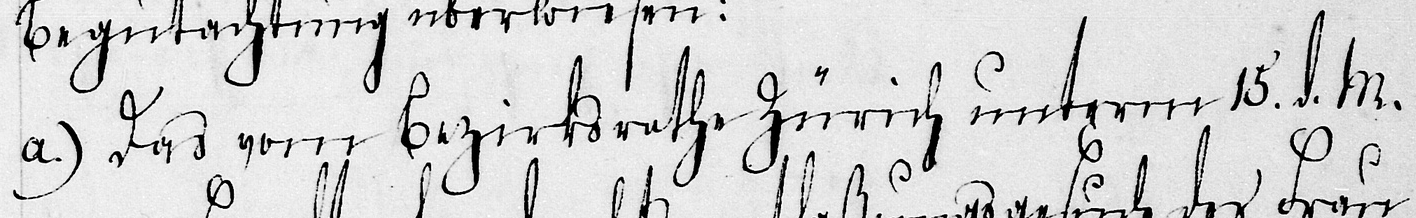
a.) Das vom Bezirksrathe Zürich unterm 15. d. M.
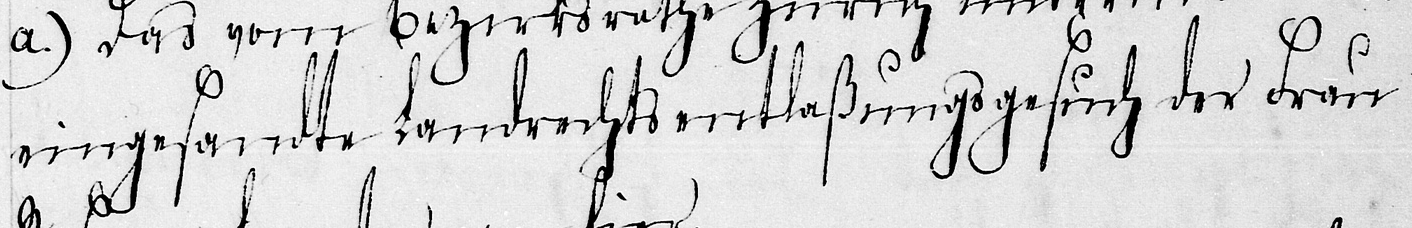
eingesandte Landrechtsentlaßungsgesuch der Frau
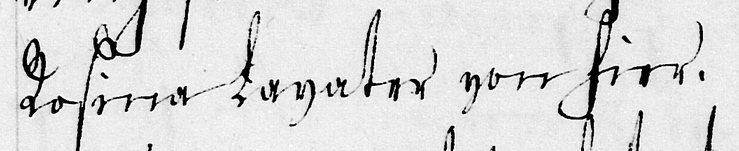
Rosina Lavater von hier.
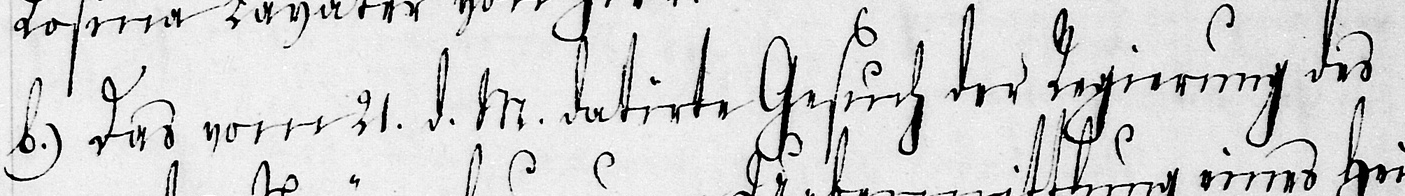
b.) Das vom 21. d. M. datirte Gesuch der Regierung des
